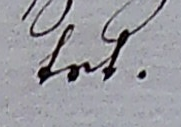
tt.
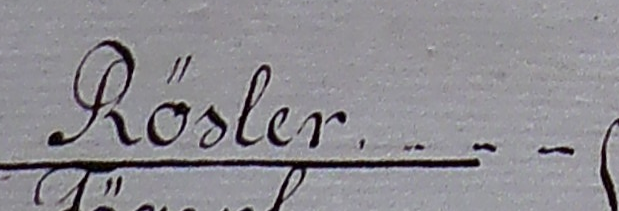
Rösler. .. .. ..
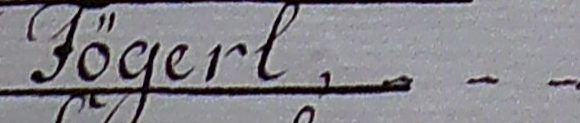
Fögerl, .. .. ..
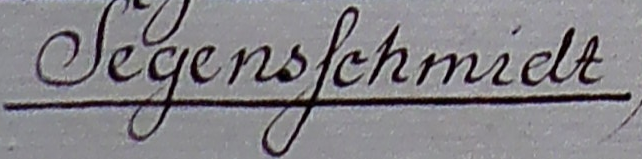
Segensschmidt
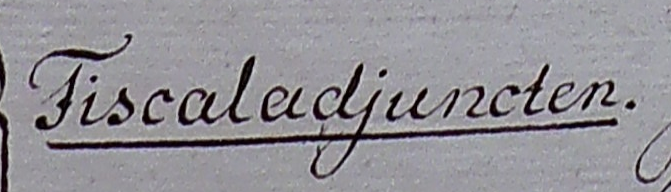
Fiscaladjuncten.
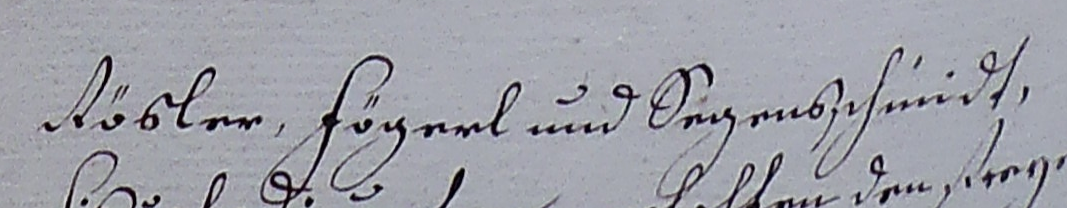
Rösler, Fögerl und Segensschmidt,
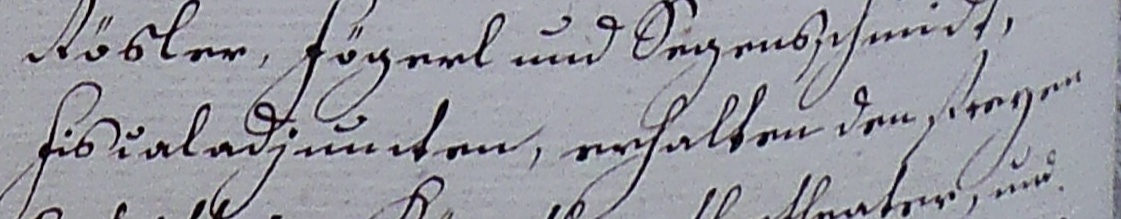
Fiscaladjuncten, erhalten den freyen
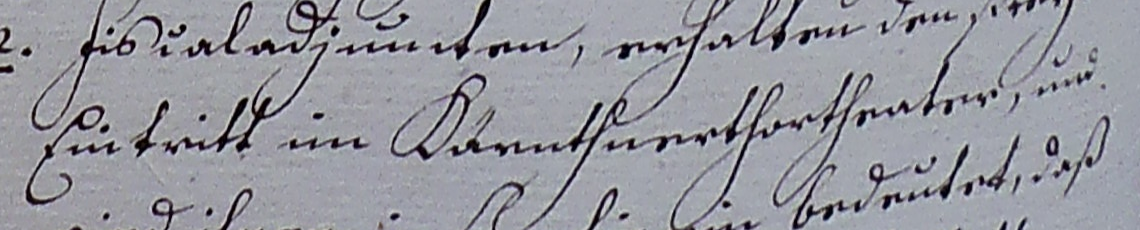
Eintritt im Kärnthnerthortheater , und
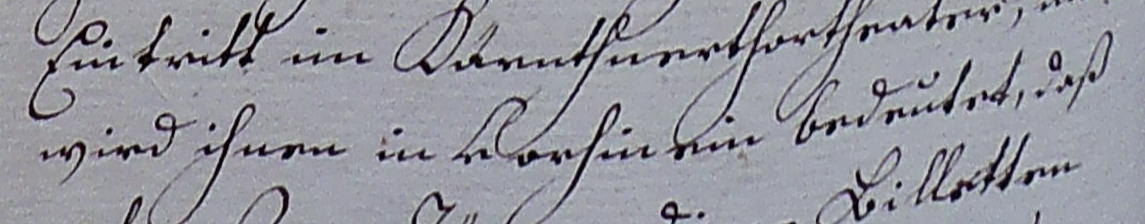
wird ihnen in vorhinein bedeutet, daß
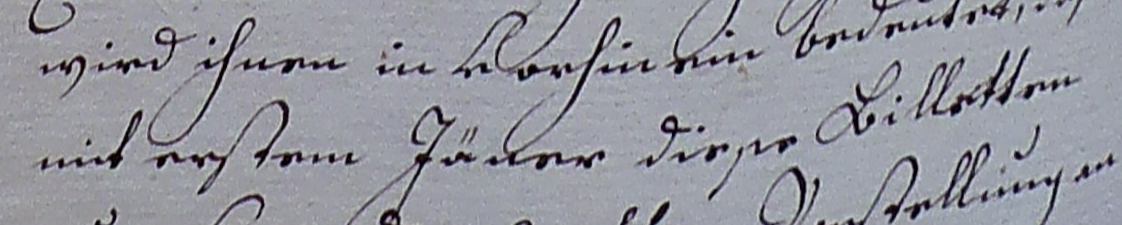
mit ersten Jäner diese Billetten
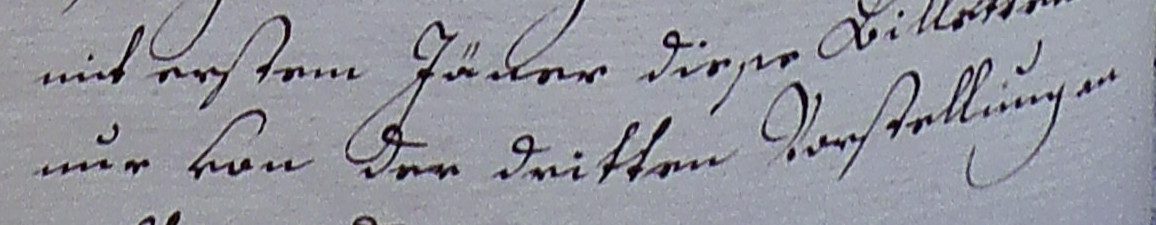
nur von der dritten Vorstellungen
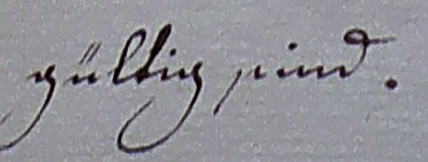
gültig sind.
